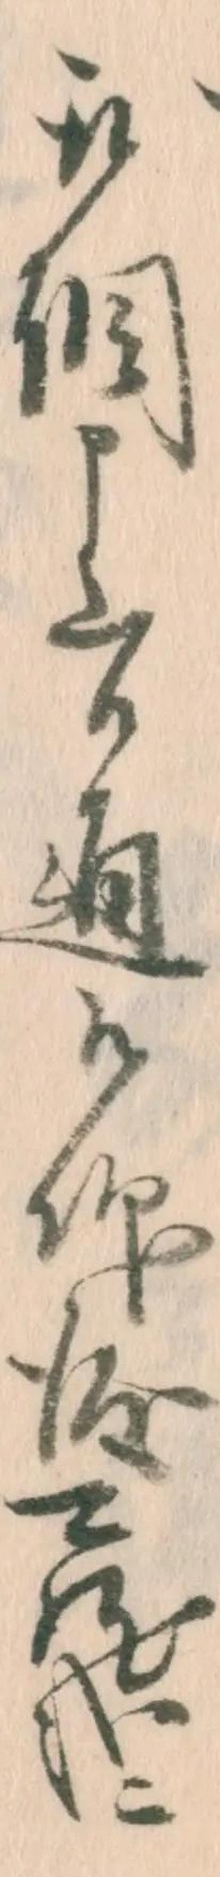取調申上候通被仰渡可然哉ニ
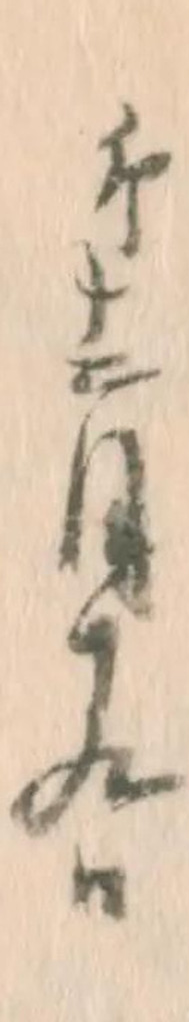卯十二月十九日
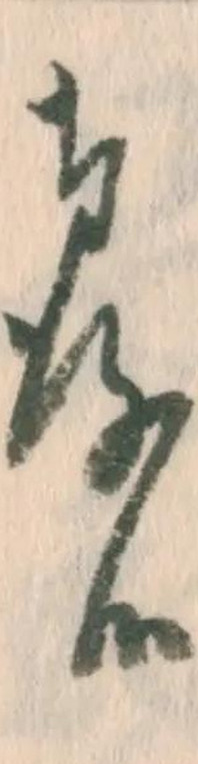奉存候
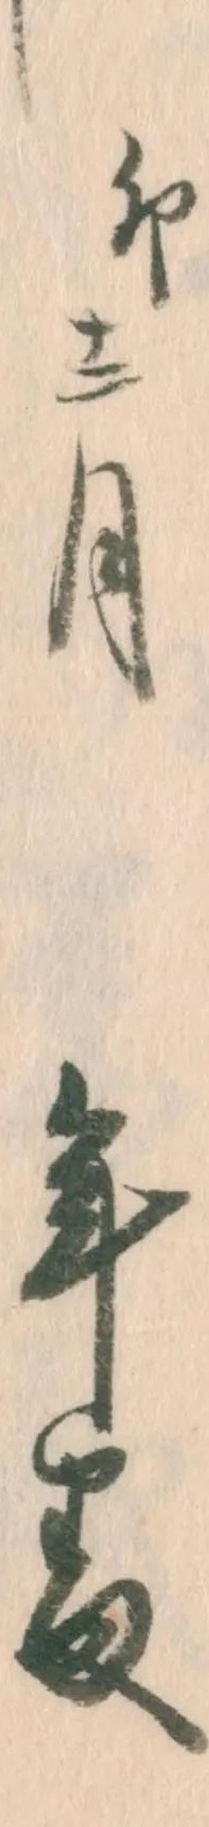卯十二月年番
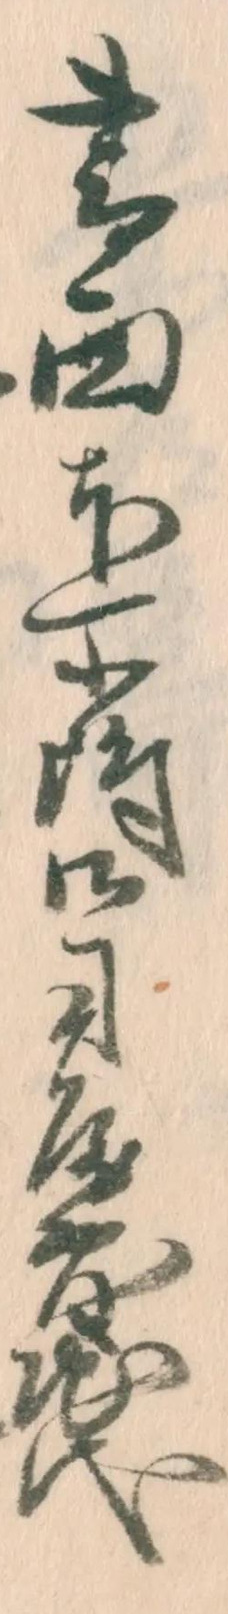書面本所附御用屋敷地代
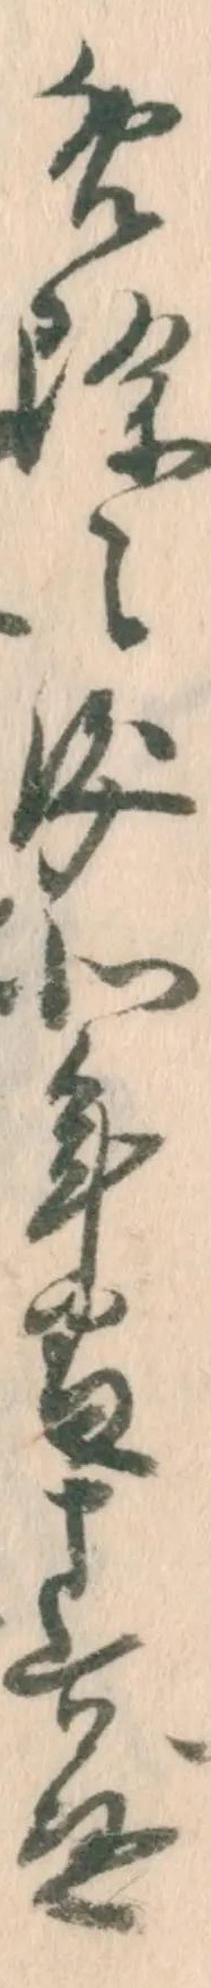免除之儀北年番申上候通
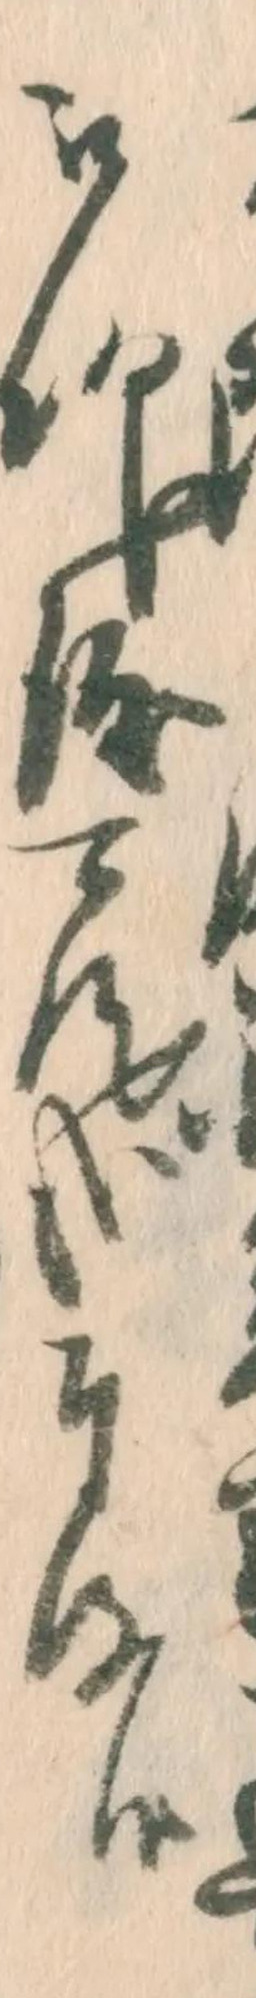被仰渡可然哉奉存候
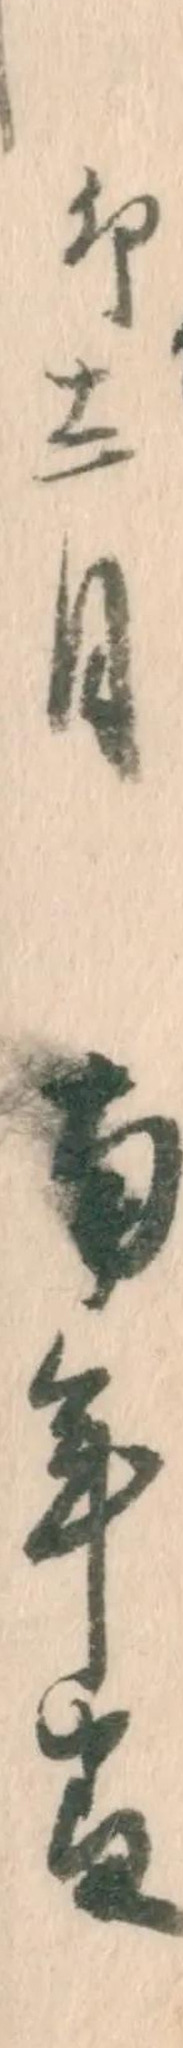卯十二月南年番

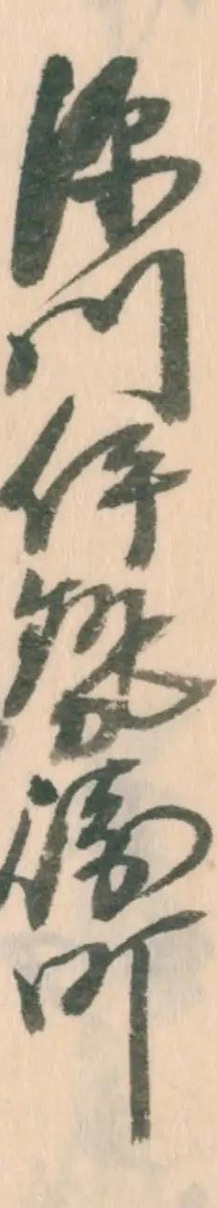深川伊勢崎町
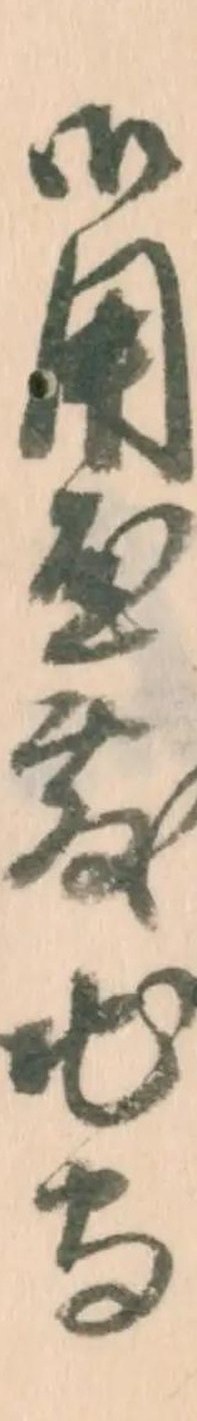御用屋敷地守
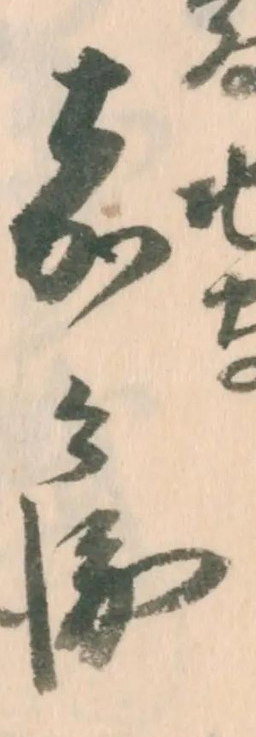嘉兵衛
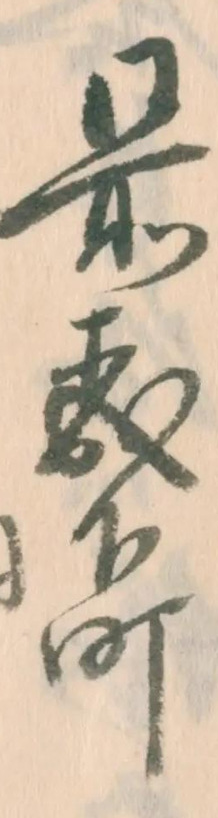同所森下町
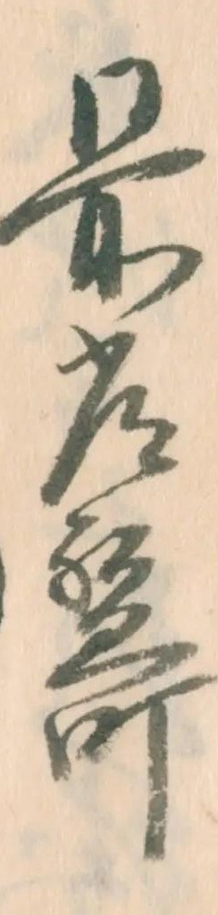同所常盤町

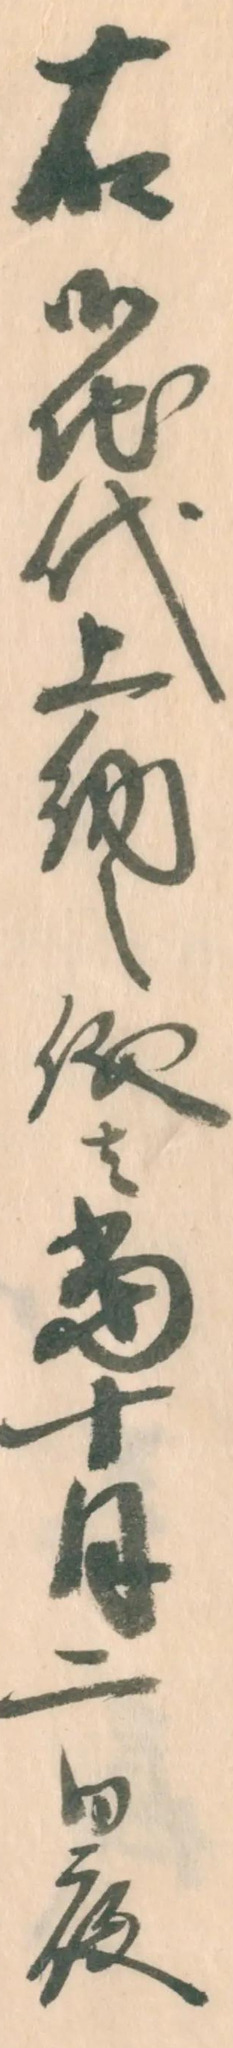右御地代上納之儀は当十月二日夜
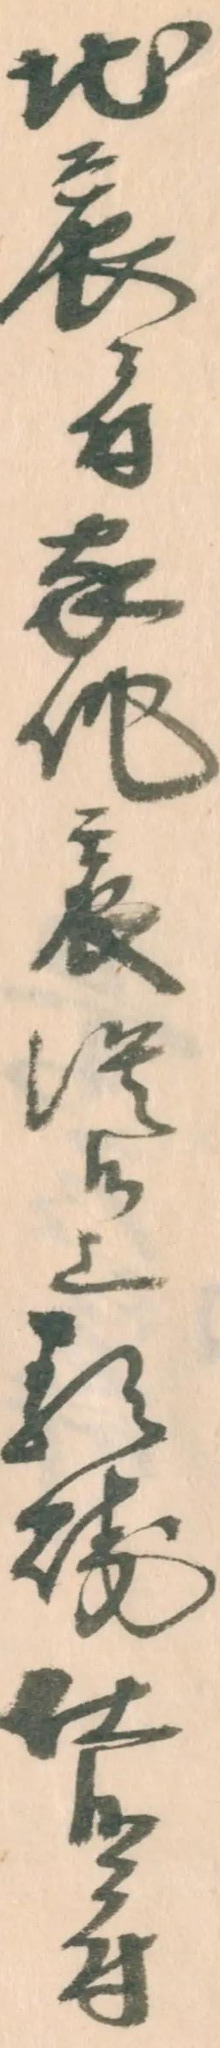地震ニ付家作震潰候上類焼仕候ニ付
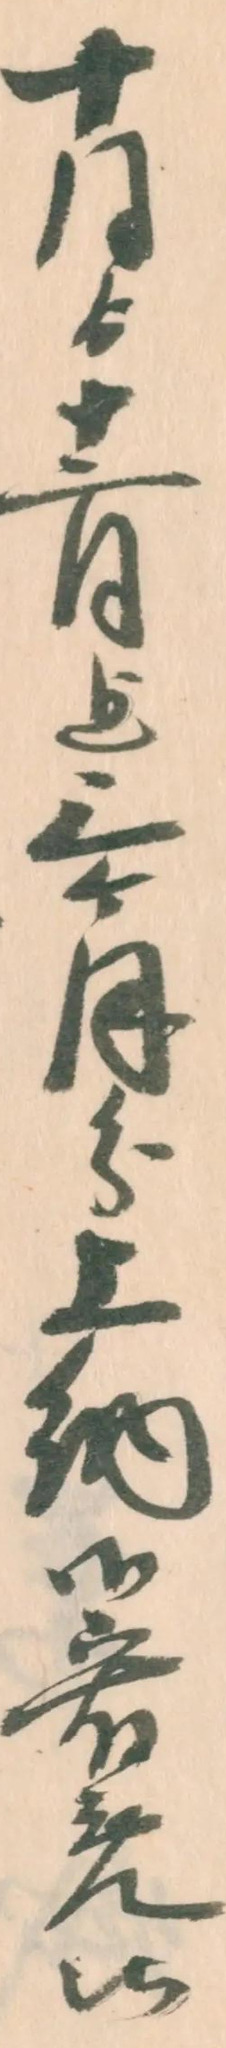十月ゟ十二月迄三ヶ月分上納御宥免被
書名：地震災書留 2巻. [1] 内表紙に「地震災書留　安政二卯年　但本所深川御用屋敷地代免除調」とあり
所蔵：国立国会図書館 National Diet Library, JAPAN
